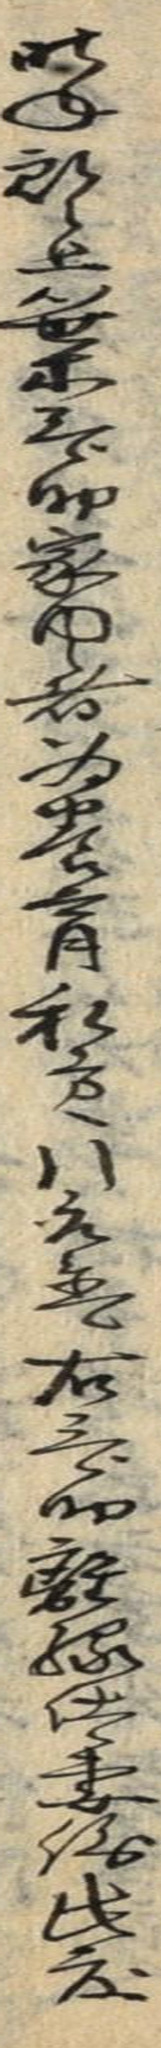昨年願之上笹木三郎助家内之者為養育私方へ引取置候右三郎助離縁仕候妻儀此度
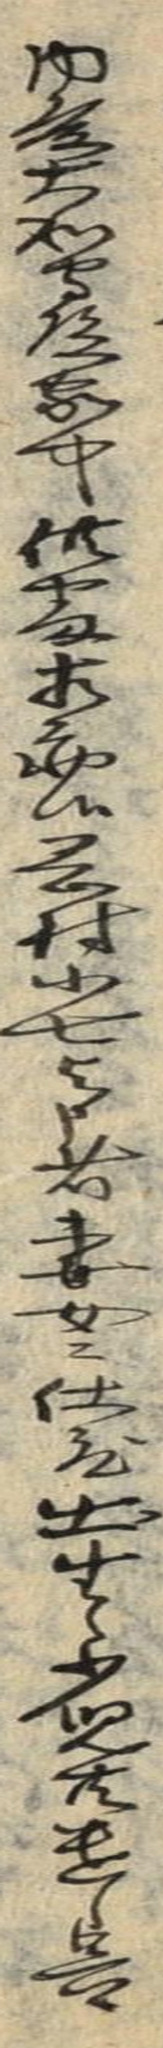内藤大和守殿家中供番相勤候岡村小七と申者妻女ニ仕度出生之少児共遣呉候
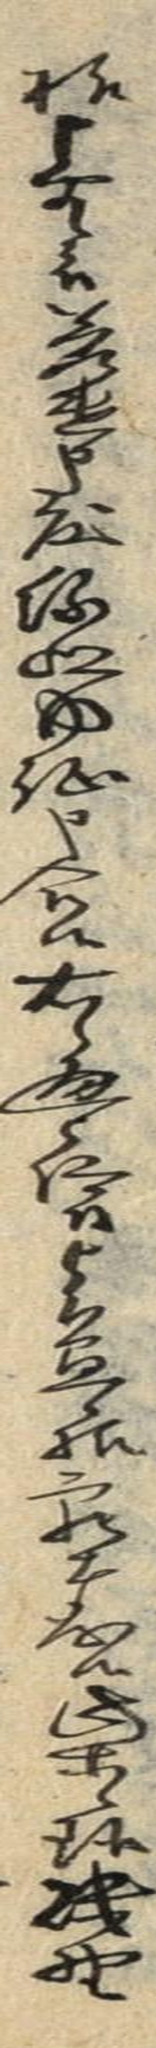様申聞ニ付差遣申度縁組内証申合候右之通被仰付被下置候様願奉存候此等之趣磯野
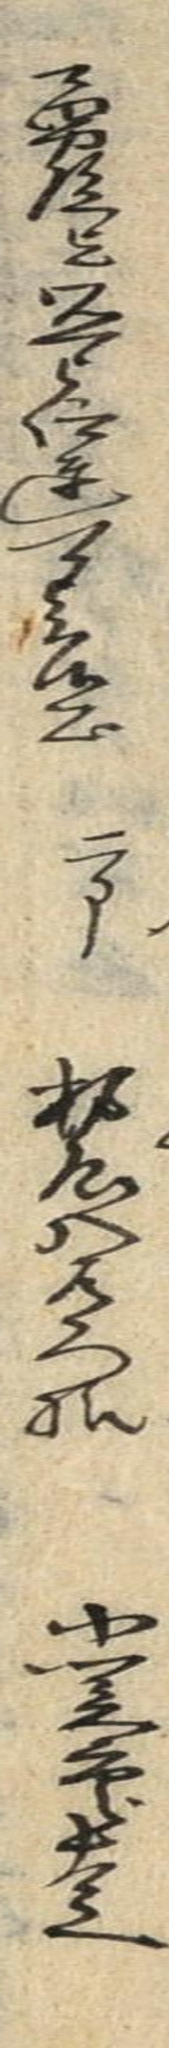勇殿迄宜被仰達可被下候以上二月栃屋八左衛門様小関市郎太夫
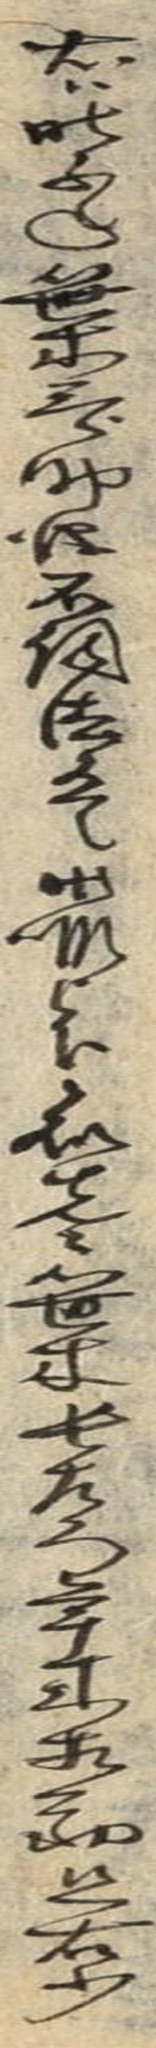右ハ昨子年笹木三郎助儀不調法有之御暇被下候処先々笹木長左衛門年来相勤且右少
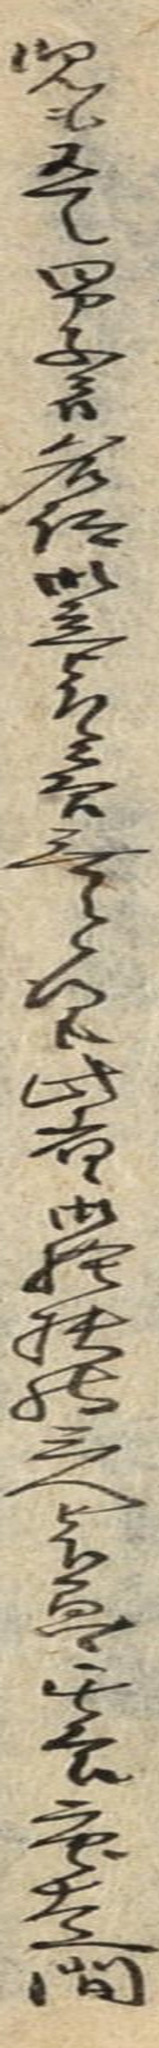児も有之男子ニ付名跡御立被下候ニ而ハ無之候得共此者之御捨扶持三人被下置候其節市郎太夫間
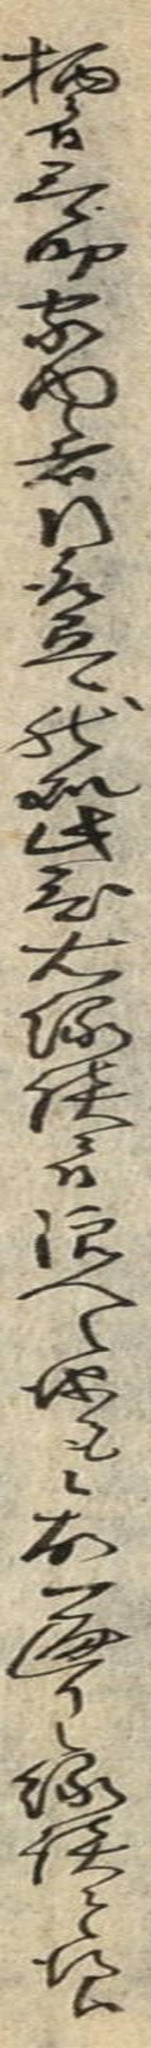柄ニ付三郎助家内之者引取置候然処此度右縁談ニ付浪人之儀ニも候故一通り之縁談ニ候得ハ
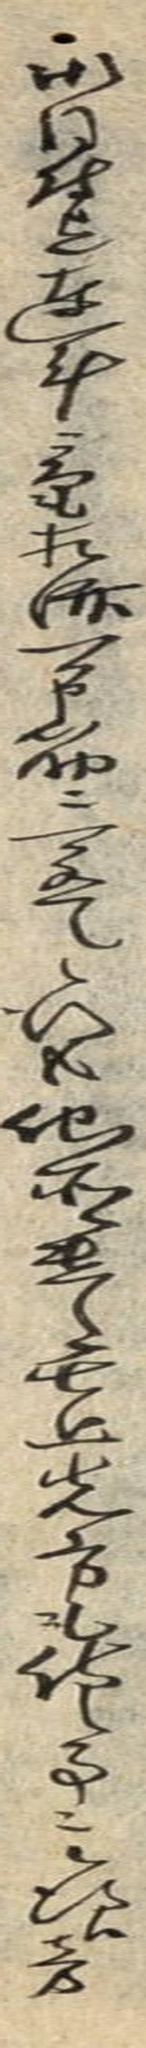御目付迄達計ニ而も相済可申筋ニ可有之候得共他所へ遣之其上先方も侍之事ニ候得ハ旁
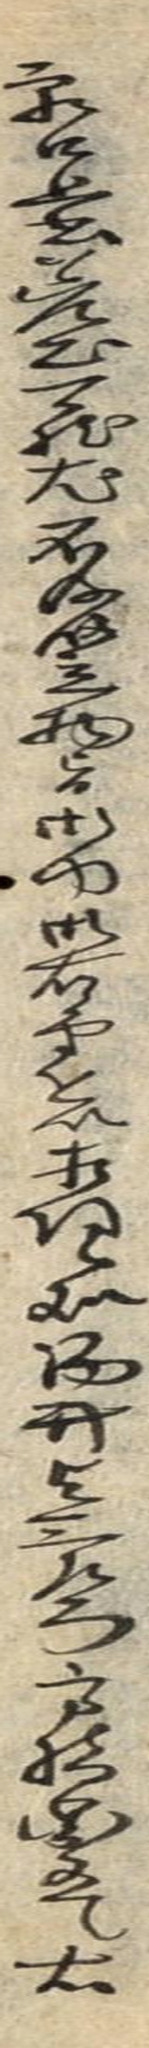願口上書差出可然尤不及竪物旨御内御右筆を以相伺候処酒井与三左衛門方指図有之右
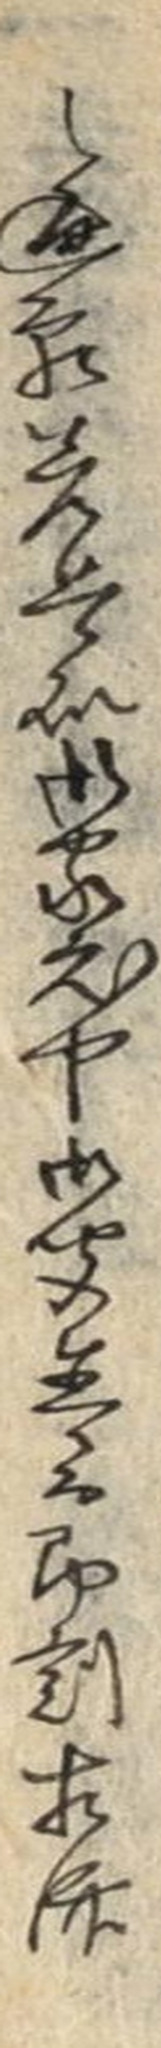之通願差上候処御家老中御聞置ニ而即刻相済
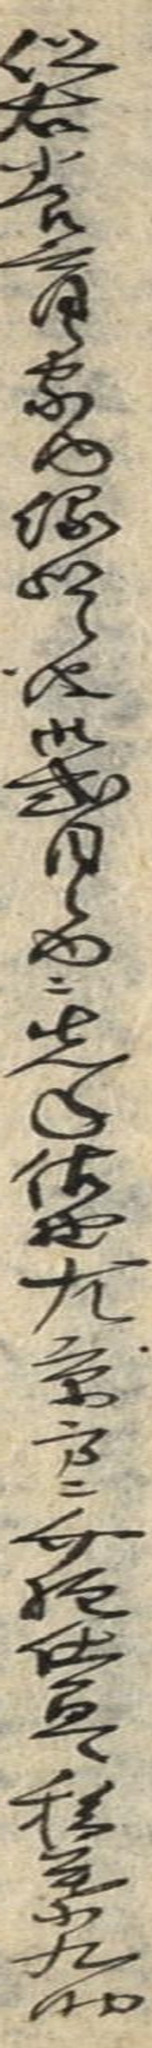但右養育之家内縁組之儀御式目之内ニ先年佐野左京方ニ介抱仕置候稲葉九助
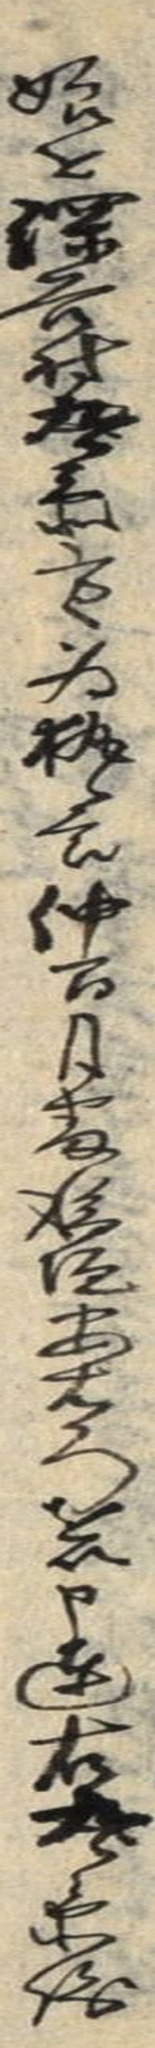娘を深谷村九郎兵衛方へ為執候節仲間月番稲垣安右衛門を以申達右九郎兵衛儀

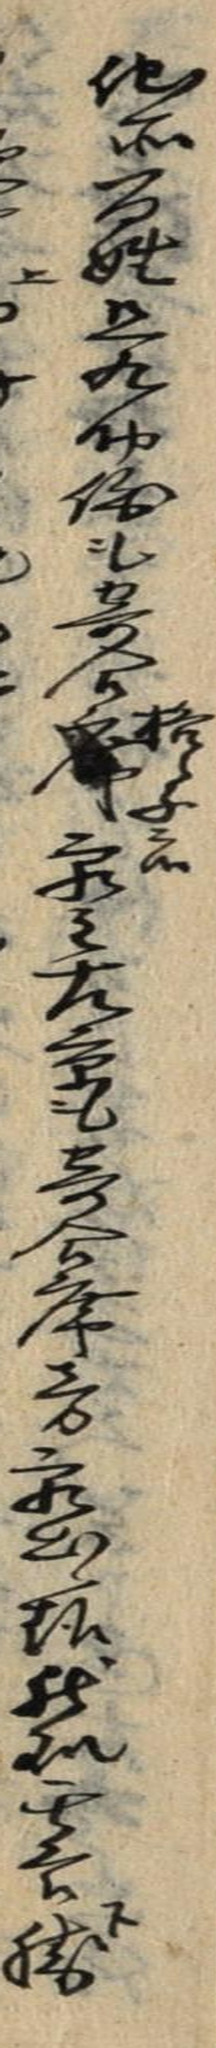他所百姓且九助儀も寄合格之子に候願主左京も寄合席旁願出候趣然処其節勝
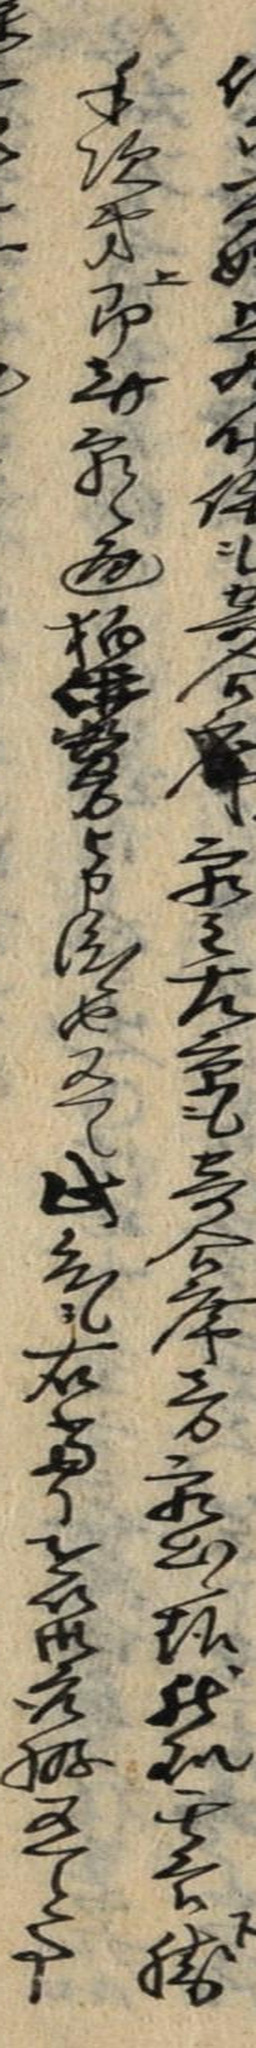手次第即刻願之通狛伊勢方被申渡候由有之此度も右当りを以御取扱有之事
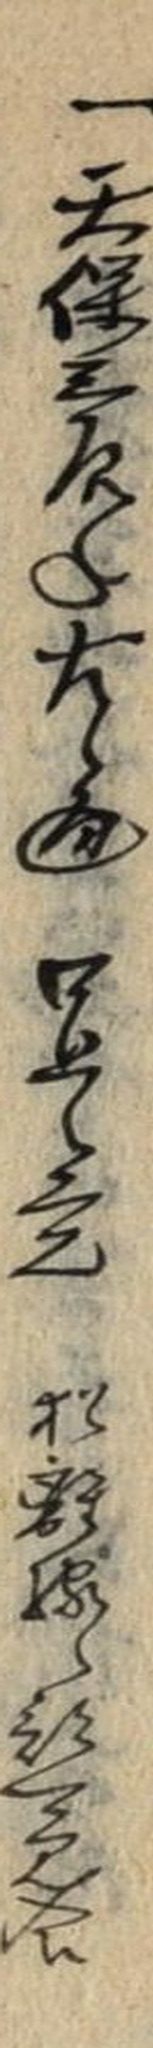一天保三辰年左之通口上之覚猶離縁之部可見合
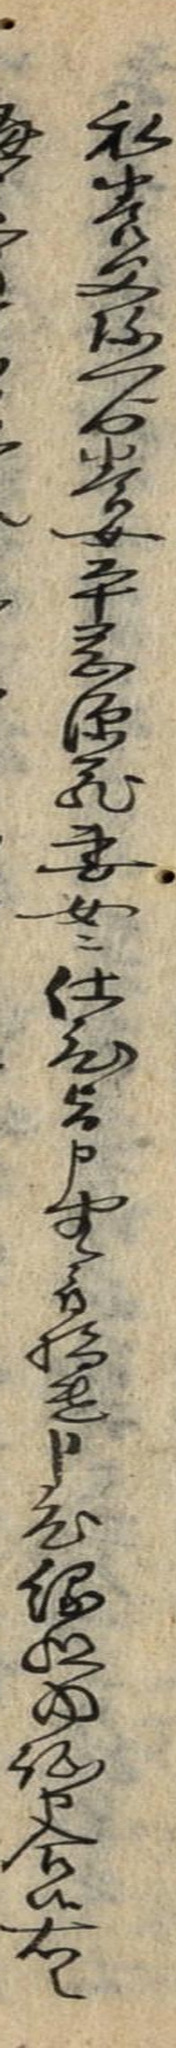私養父弥一右衛門養女平岡源蔵妻女ニ仕度旨申聞候ニ付指遣申度縁組内証申合候右之
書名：養子縁組之部
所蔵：福井県文書館 Fukui Prefectural Archives
